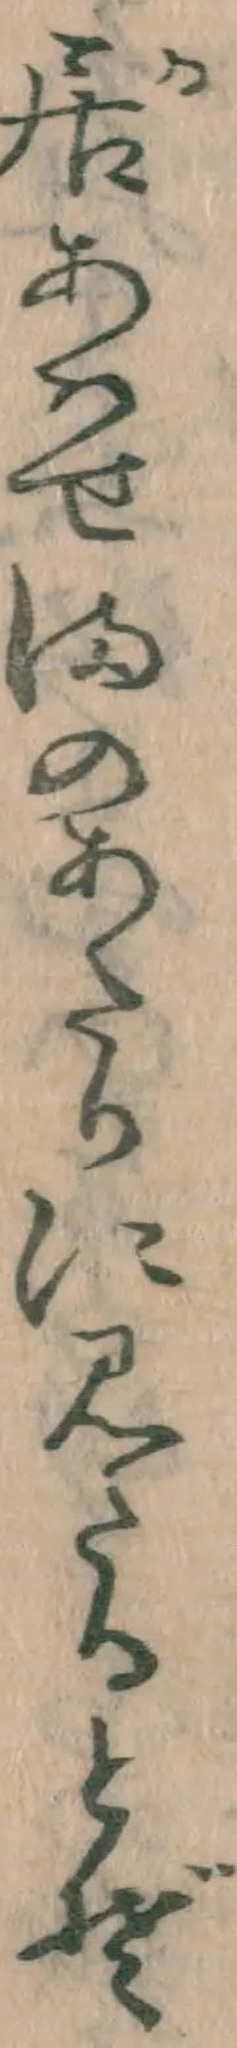居あはせまのあたりに見たるとぞ
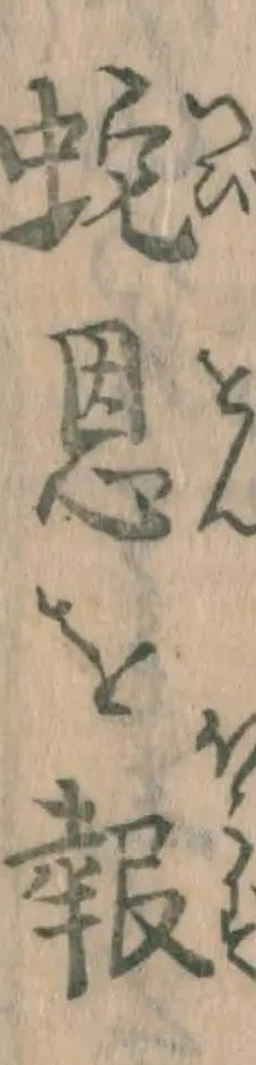蛇恩を報
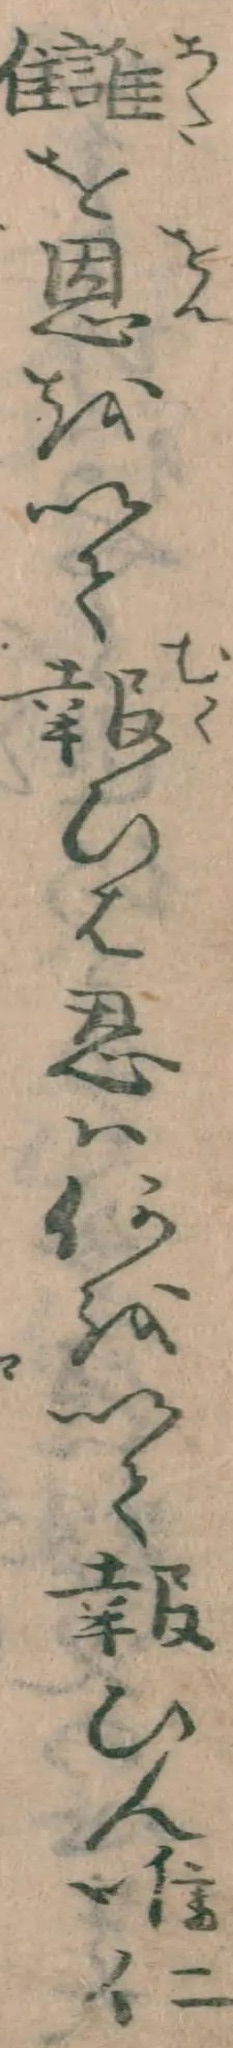讐を恩を以て報ひは恩は何を以て報ひん唯仁
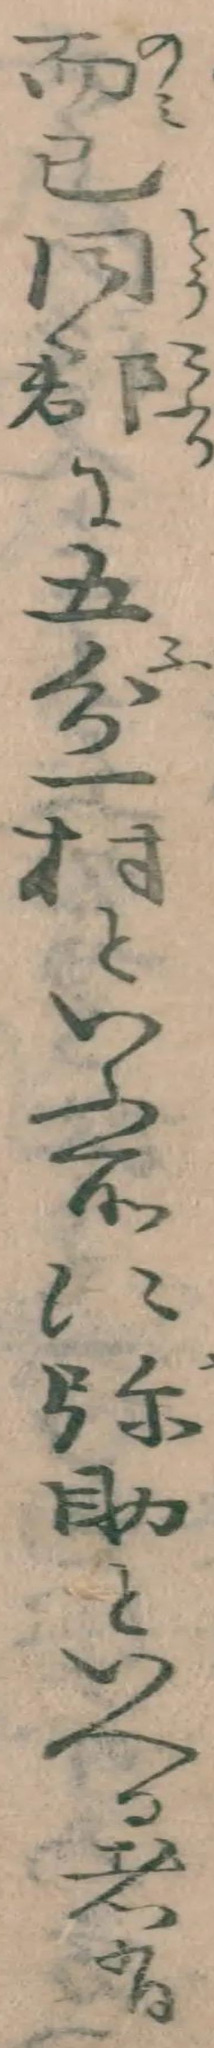而已同郡に五分一村といふ所に弥助といへる者有
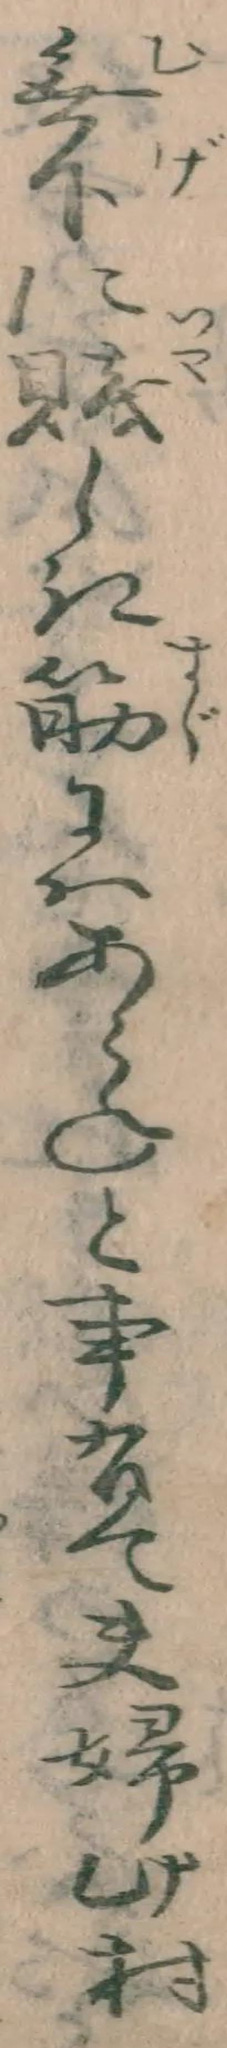無下に賎しき筋にはあらねと事有て夫婦此村
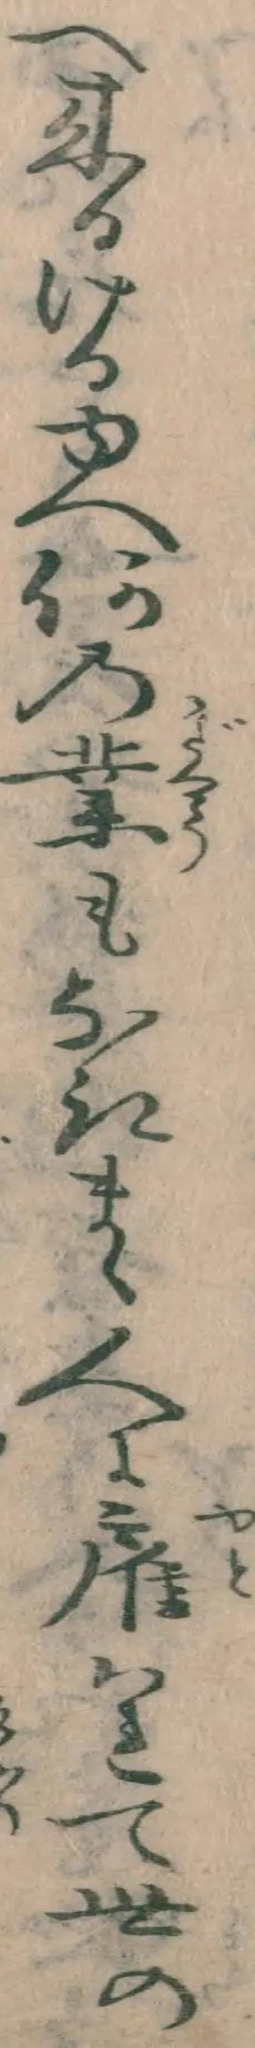へ来りけるゆへ何の業もなきまゝ人に雇はれて世の
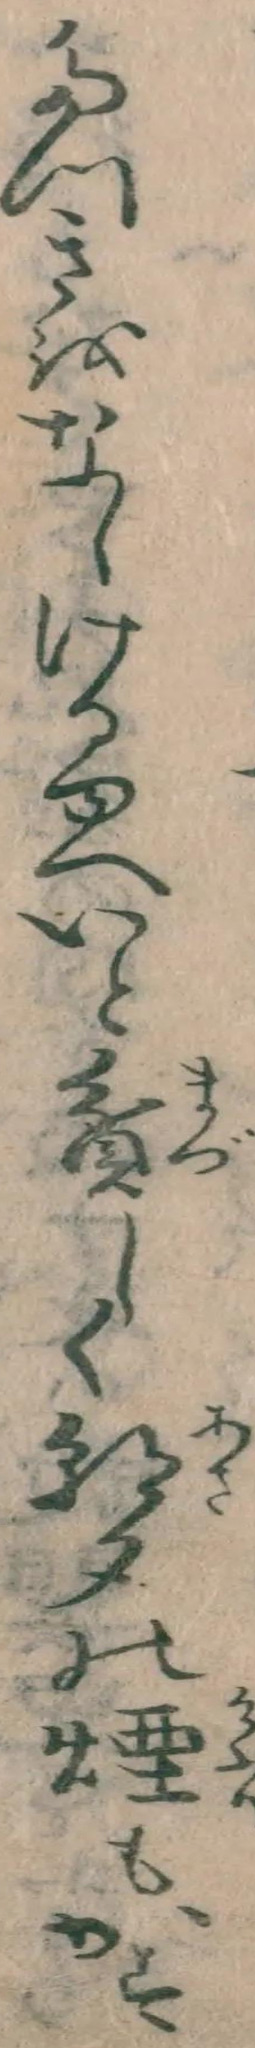たつきをなしけるゆへいと貧しく朝夕の煙もかす
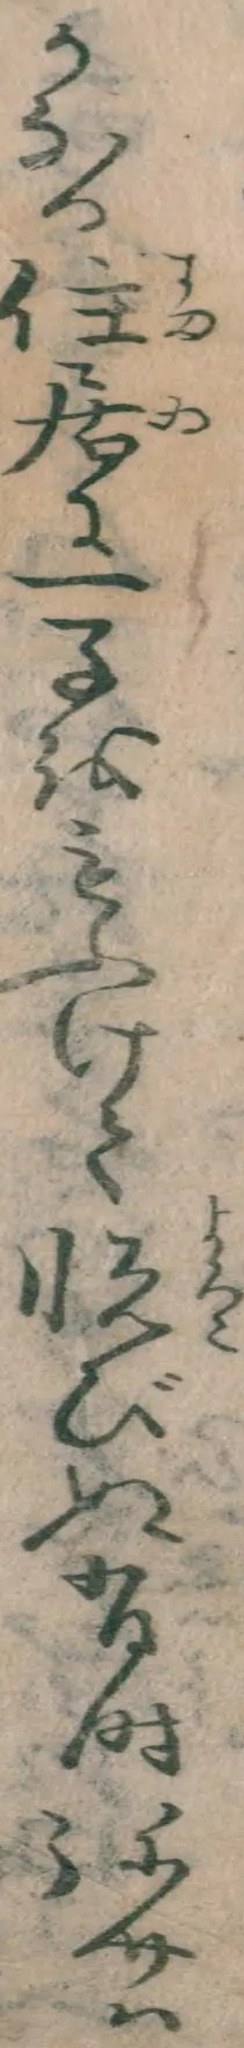かなる住居に一子をもふけて悦びぬ有時弥介は
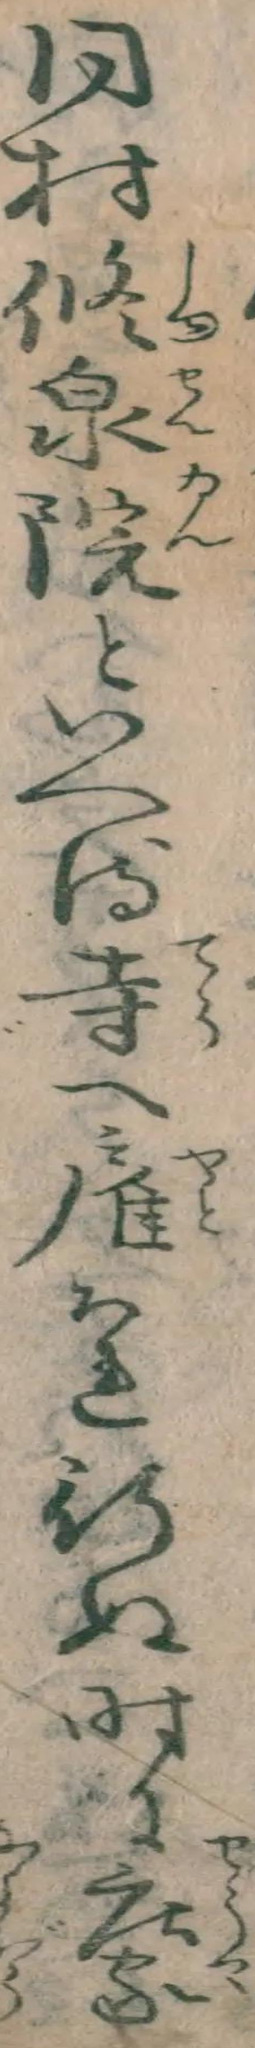同村修泉院といへる寺へ雇はれ行ぬ時に庄屋
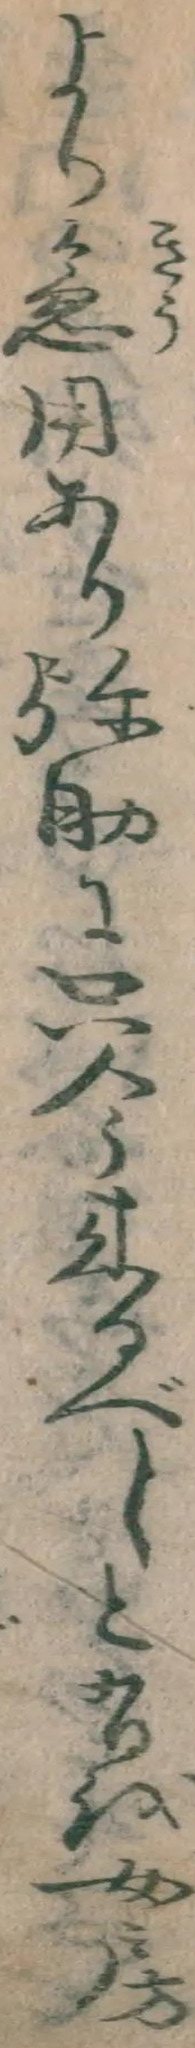より急用あり弥助に只今来るべしと有を女房
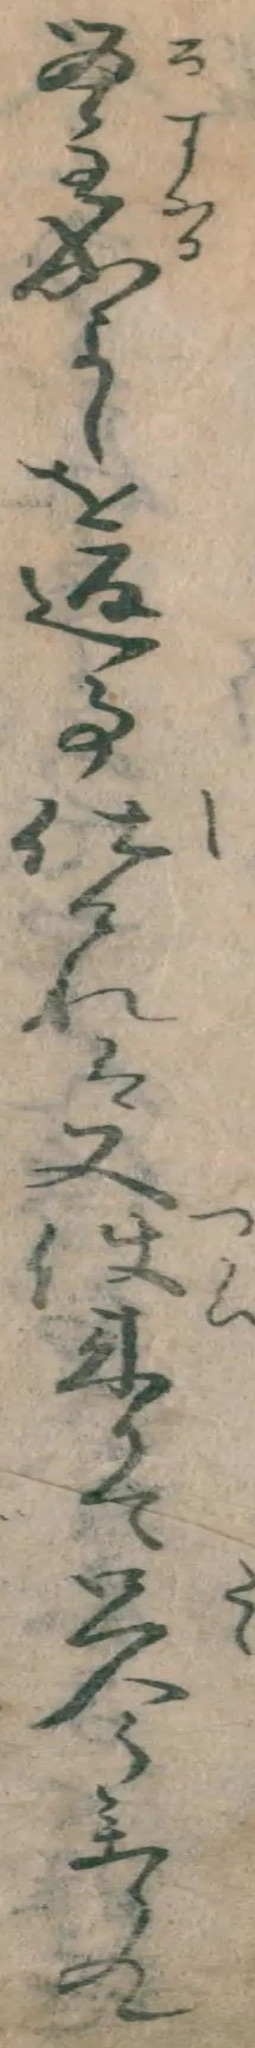留主成よしを返事仕けば又使来りて只今に出られ
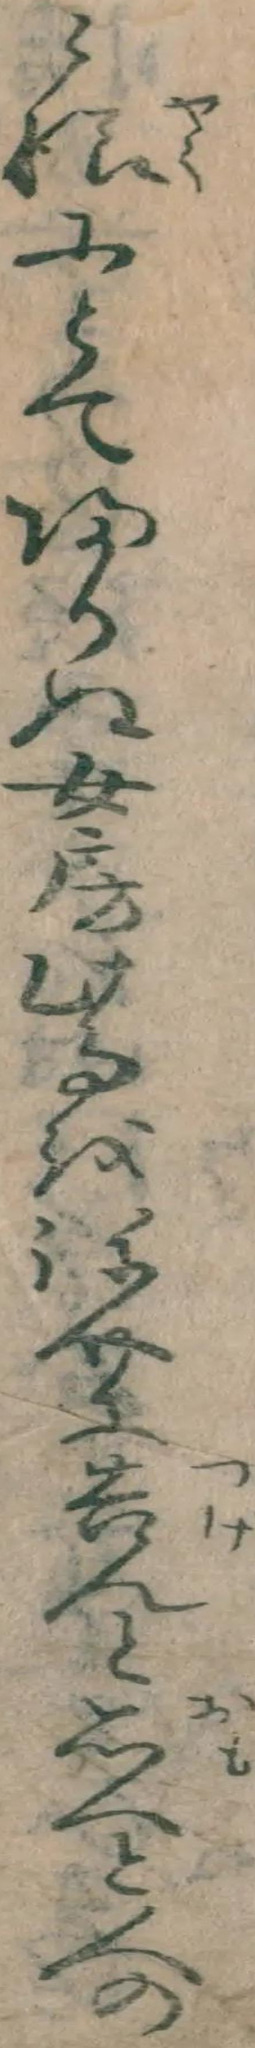候様にとて帰りぬ女房此事を弥介に告んと思へと人の

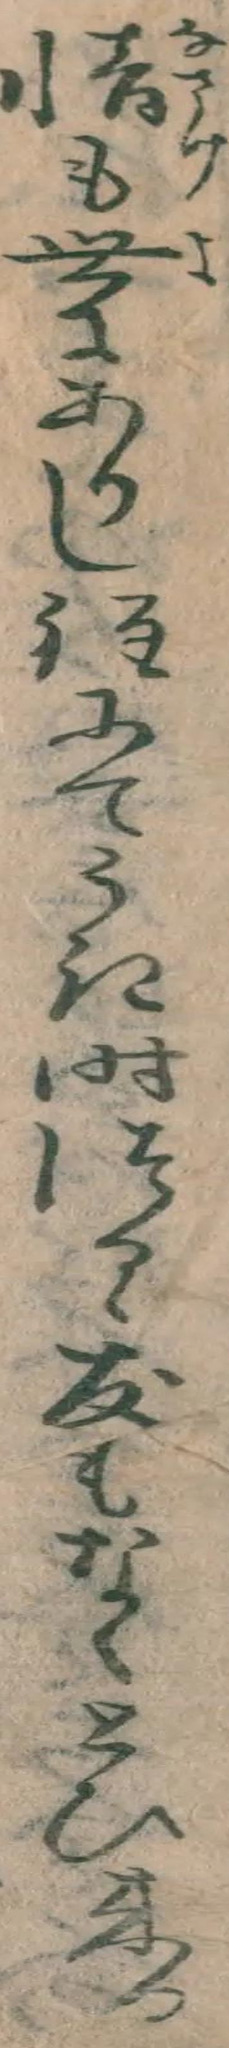情も世にありし程にてうき時つるゝ友もなくとひ来る
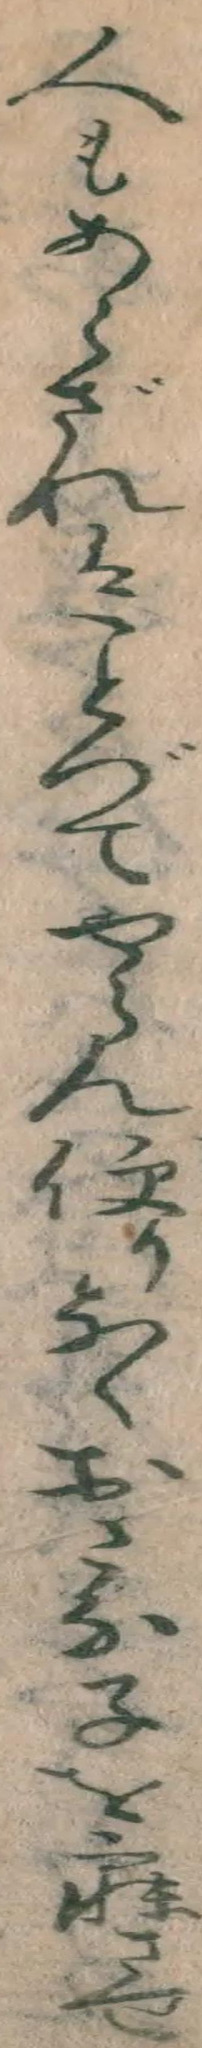人もあらざれはことづてやらん便りなくおさな子を寝させ
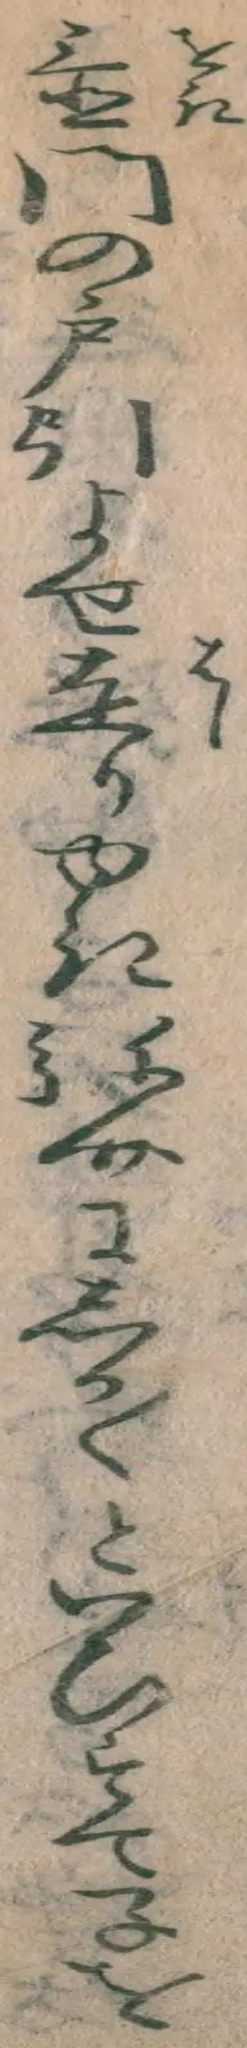置門の戸引よせ走りゆき弥介にしか〳〵といひすて子を
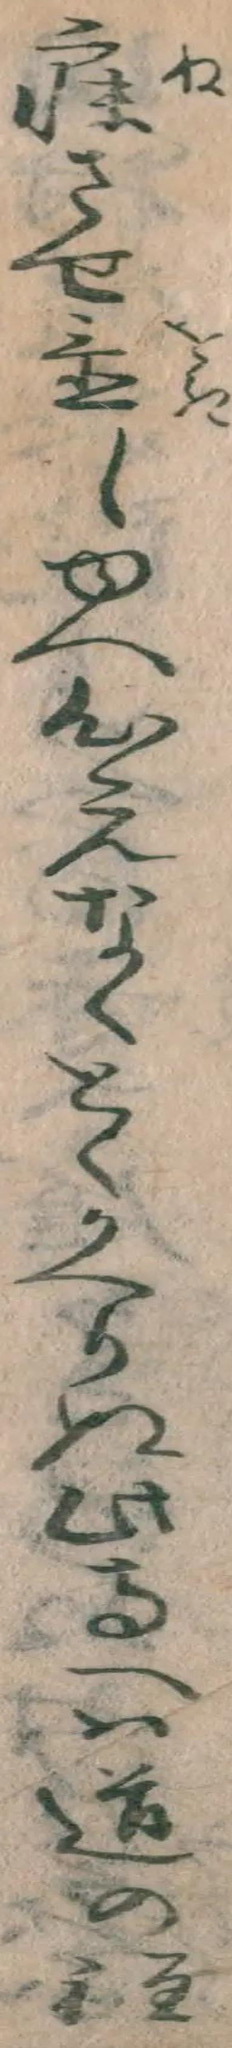寝させ置しゆへ心こんなくとくかへりぬ此寺へは道の程
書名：怪談御伽童 5巻. [1]
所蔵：国立国会図書館 National Diet Library, JAPAN
